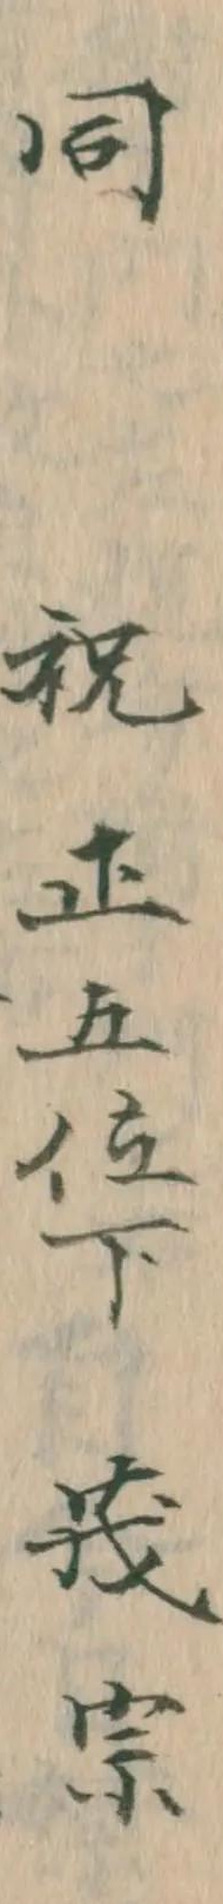同祝正五位下茂宗
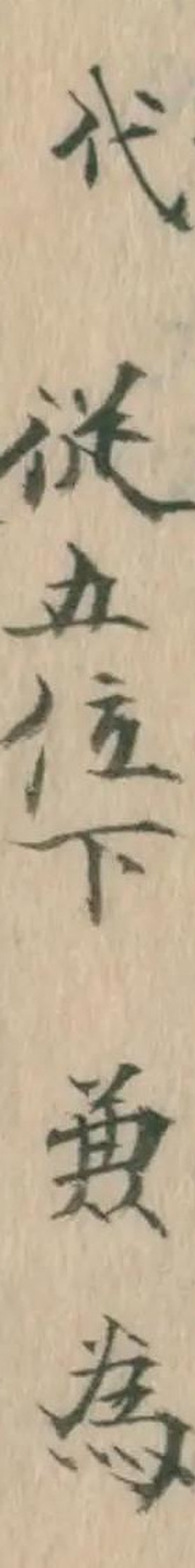代従五位下兼為
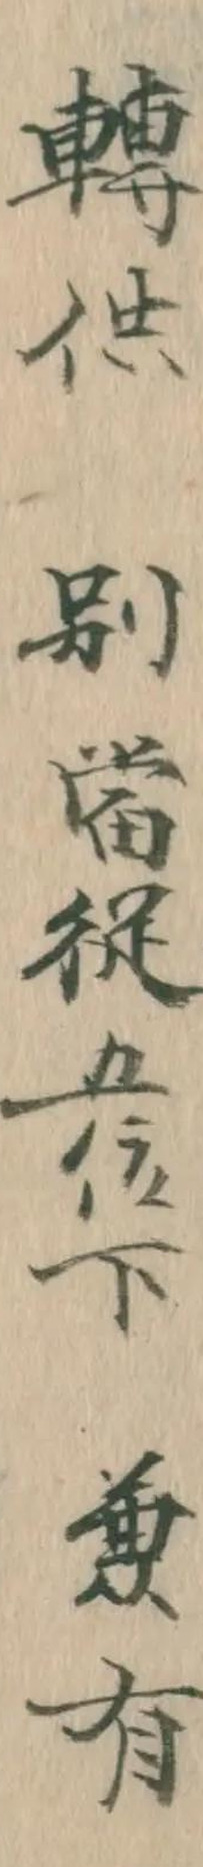転供別当従五位下兼有
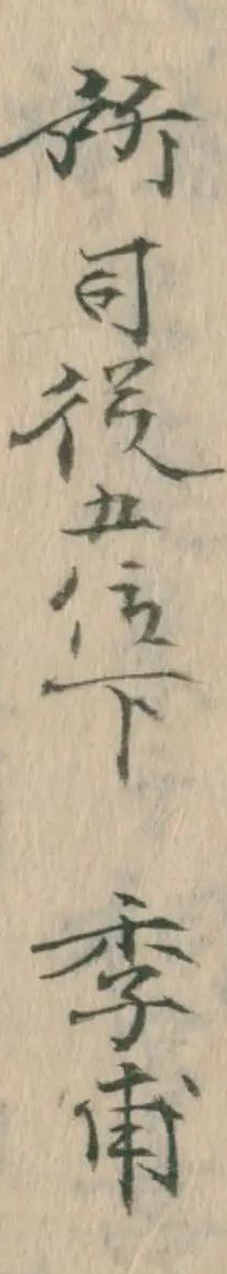所司従五位下季甫
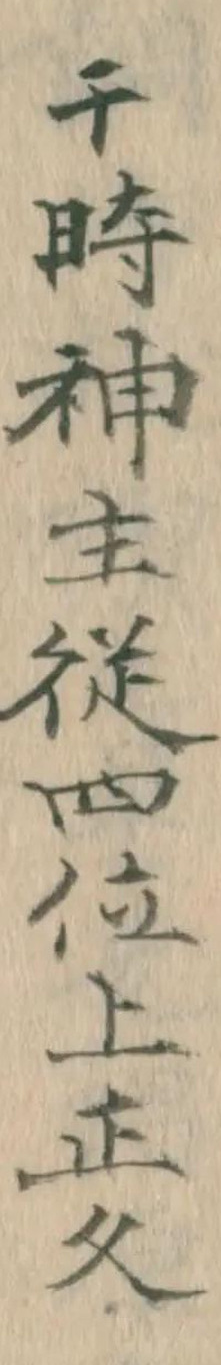于時神主従四位上正久
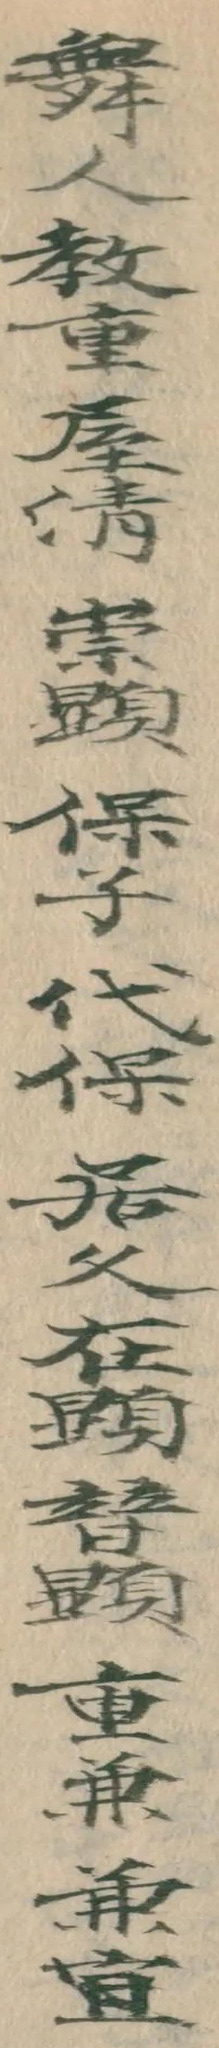舞人教重屋清崇顕保子代保居久在顕暜顕重兼兼宣
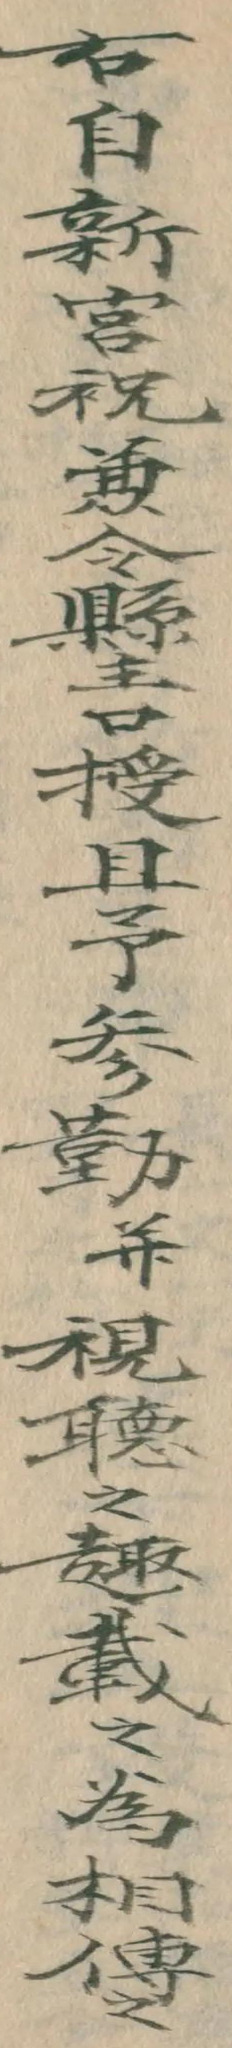右自新宮祝兼令県主口授且予参勤并視聴之趣載之為相伝之
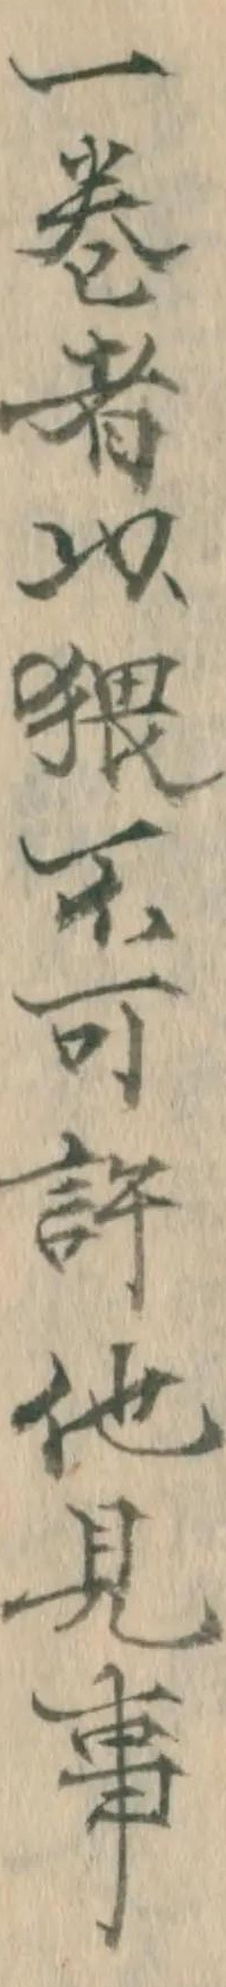一巻者以猥不可許他見事
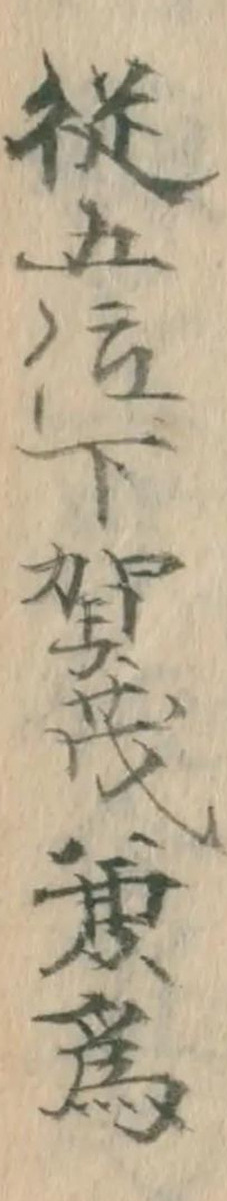代従五位下兼為

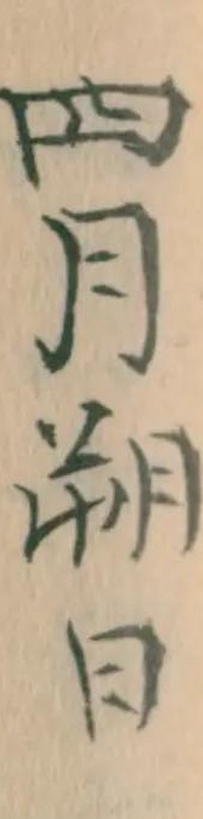四月朔日
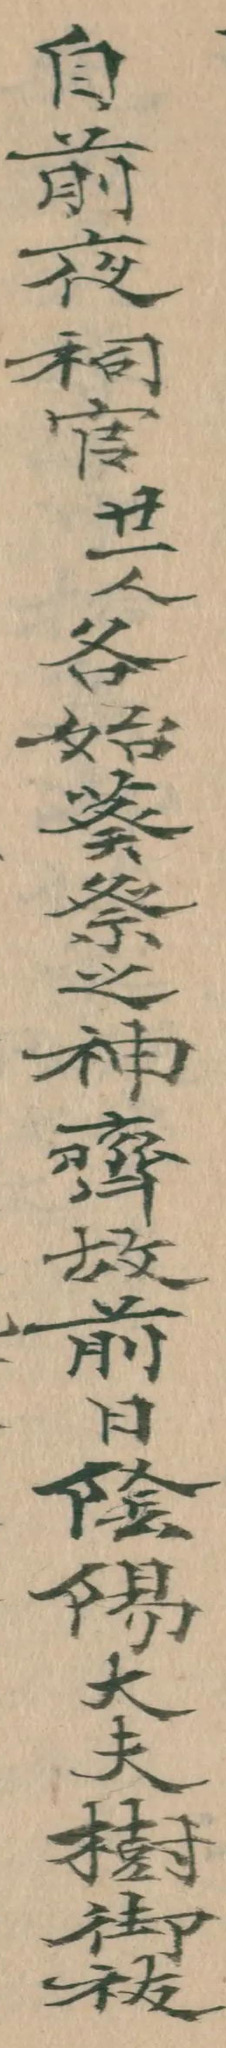自前夜祠官廿一人各始葵祭之神斉故前日陰陽大夫樹御祓
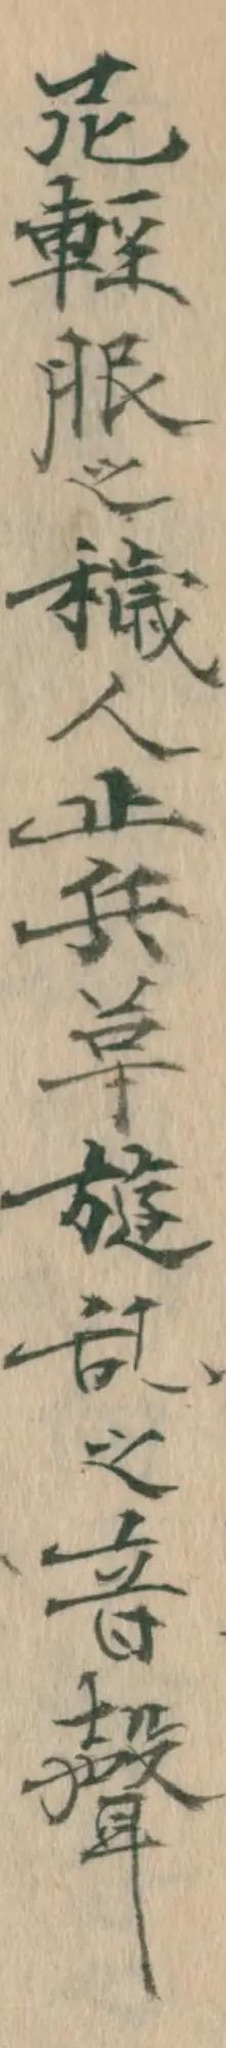尼軽服之穢人止兵草遊乱之音声
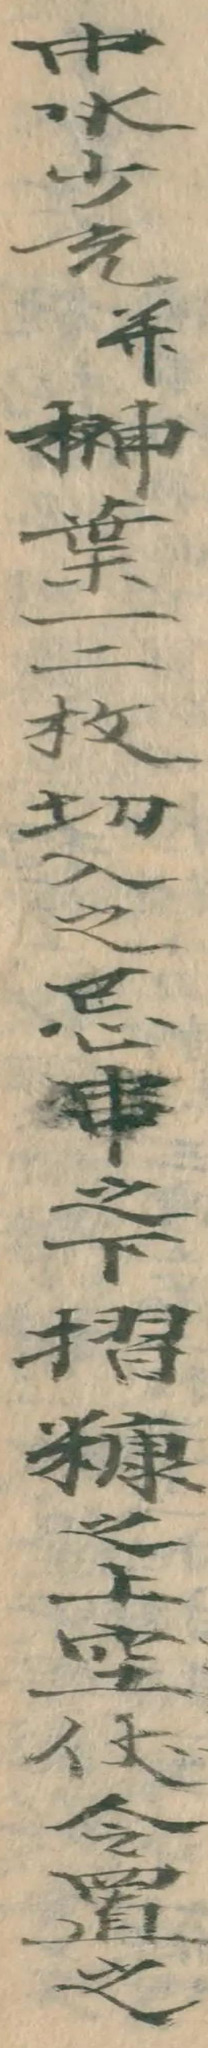中水少充并榊葉一二枚切入之忌串之下摺糠之上空伏令置之

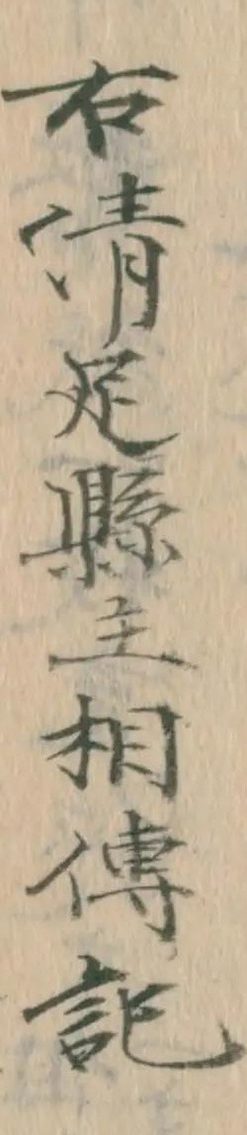右清足県主相伝記

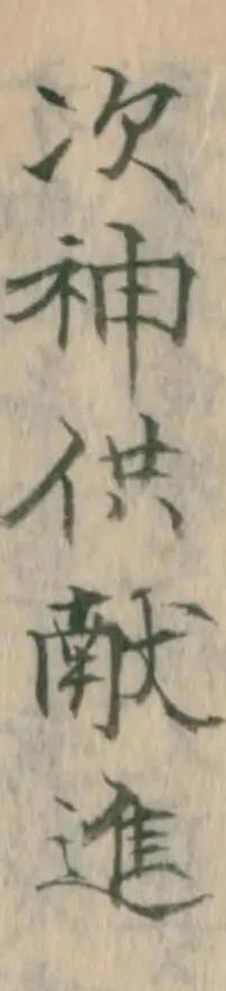次神供献進
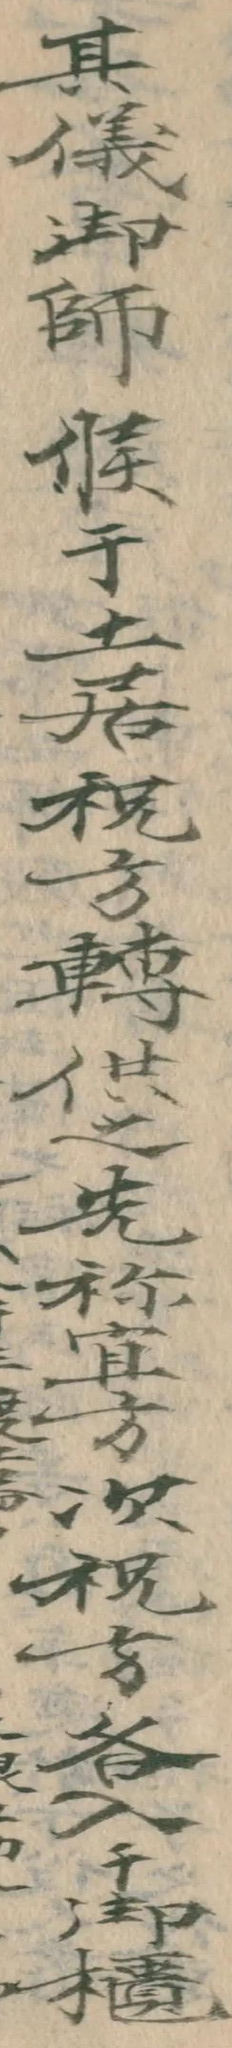其儀御師候于土居祝方転供之先祢宜方次祝方各入于御櫃
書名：賀茂社記録. 第9冊
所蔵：国立国会図書館 National Diet Library, JAPAN
